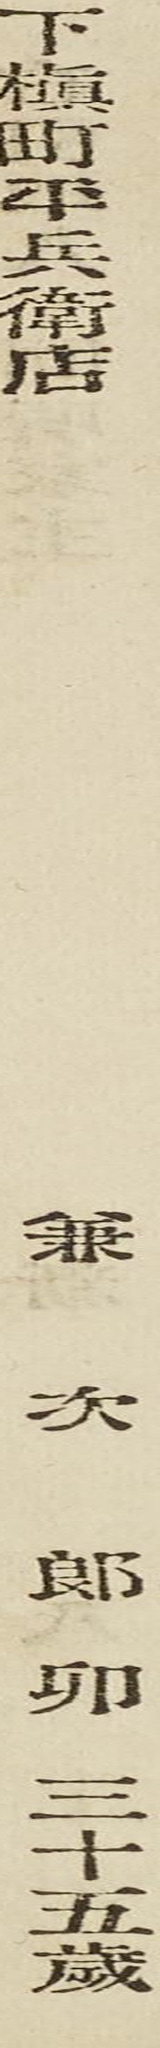一下槇町平兵衛店兼次郎卯三十五歳
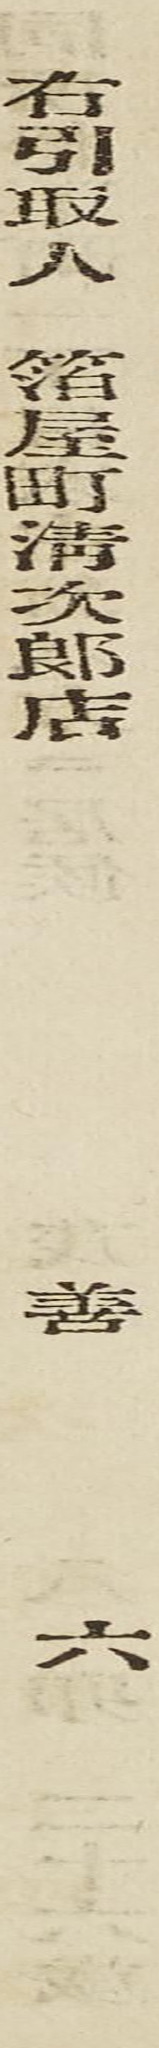右引取人箔屋町清次郎店善六
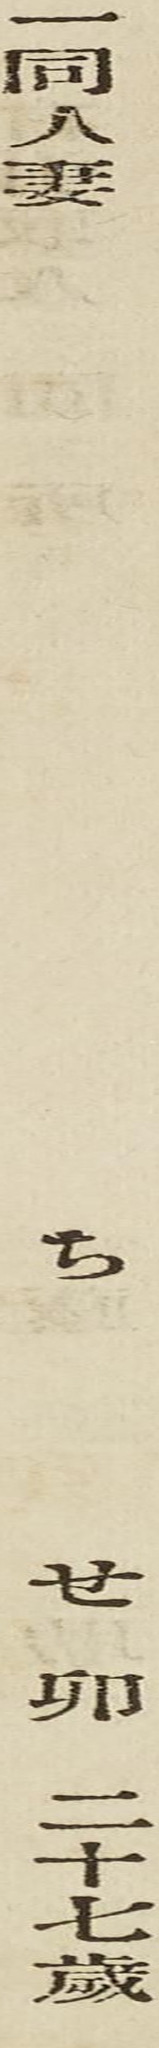一同人妻ちせ卯二十七歳
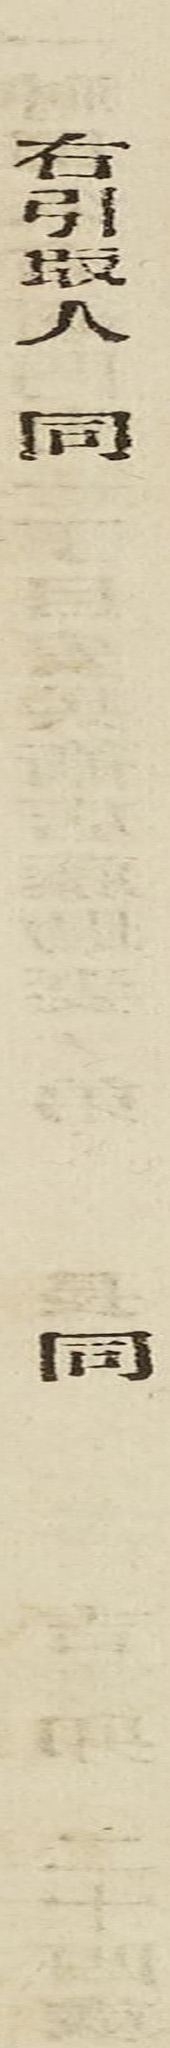右引取人同同
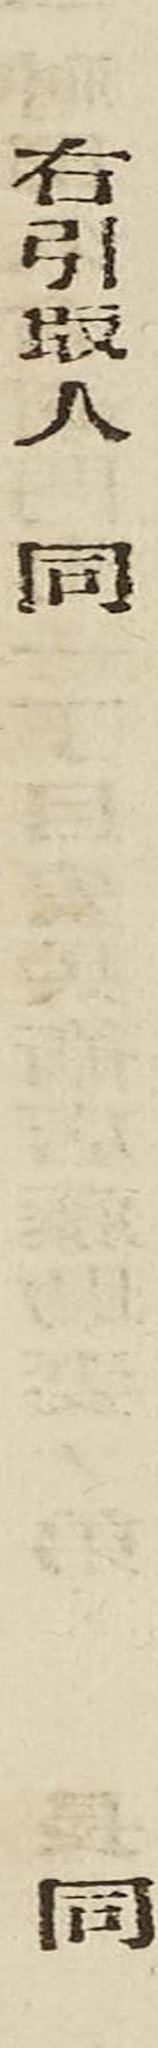右引取人同同
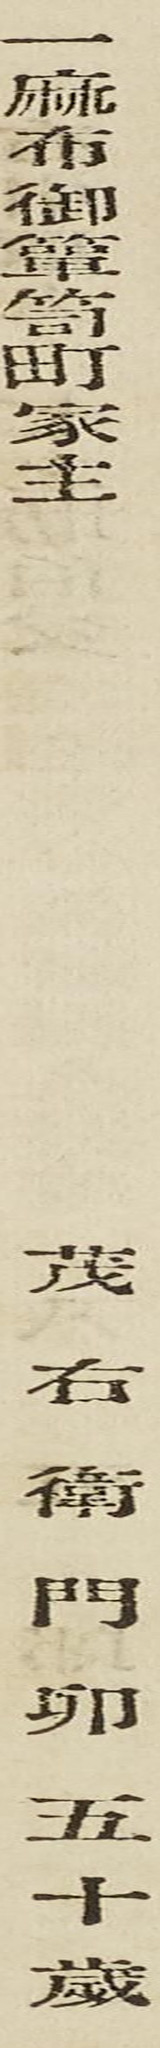一麻布御箪笥町家主茂右衛門卯五十歳
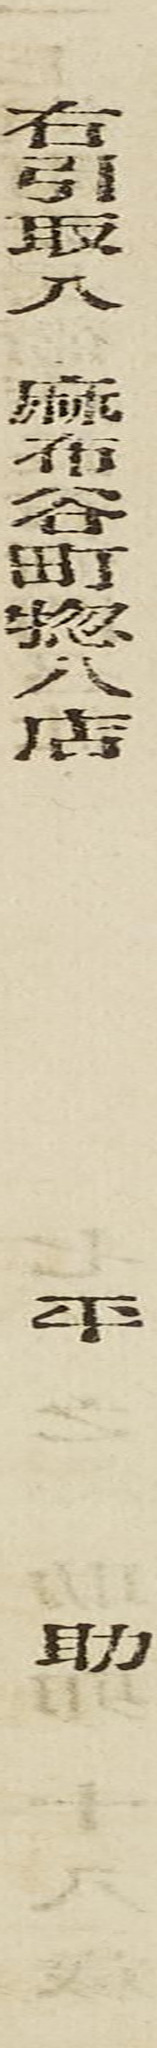右引取人麻布谷町惣八店平助
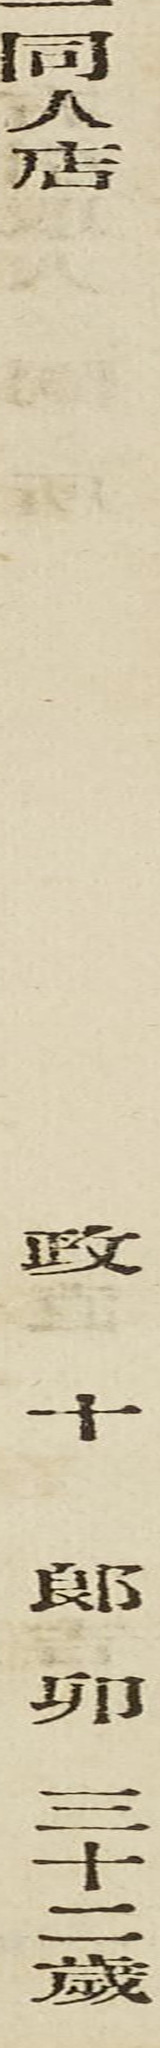一同人店政十郎卯三十二歳
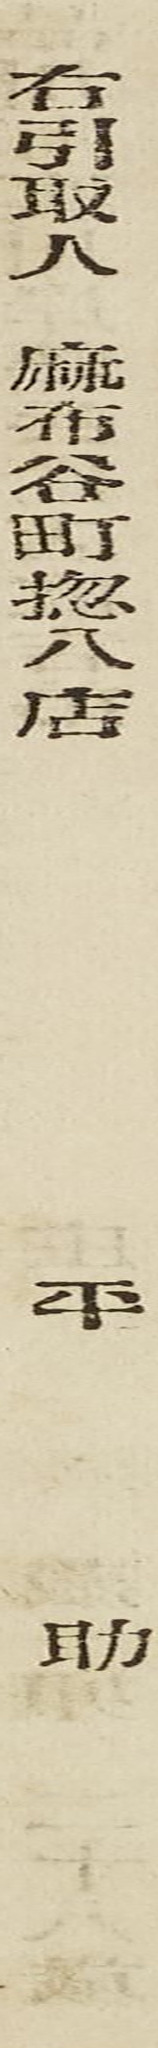右引取人麻布谷町惣八店平助
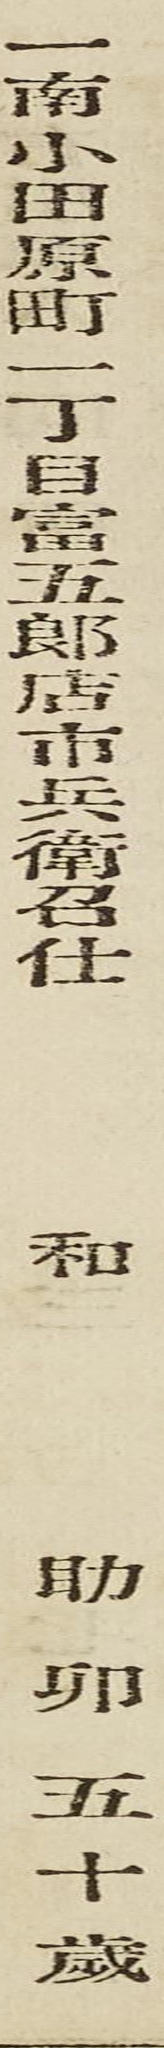一南小田原町一丁目冨五郎店市兵衛召仕和助卯五十歳
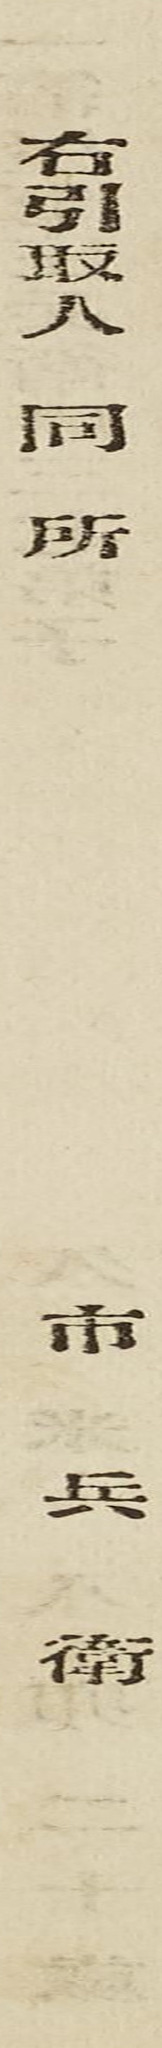右引取人同所市兵衛
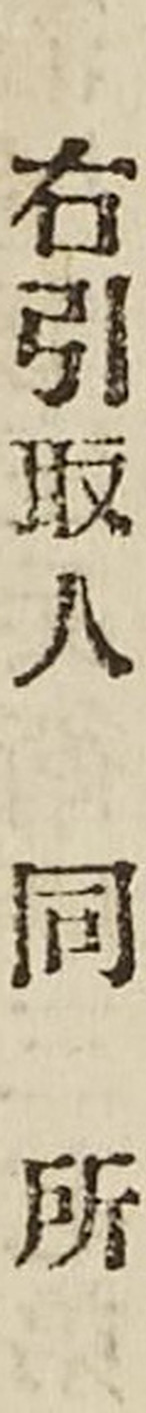右引取人同同
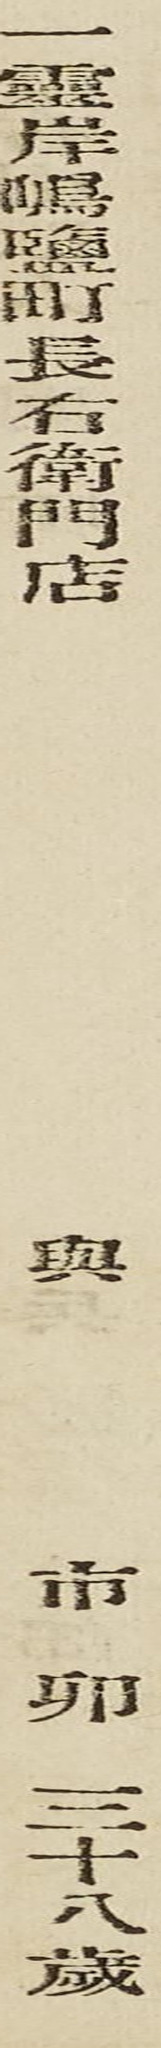一霊岸嶋鹽町長右衛門店與市卯三十八歳
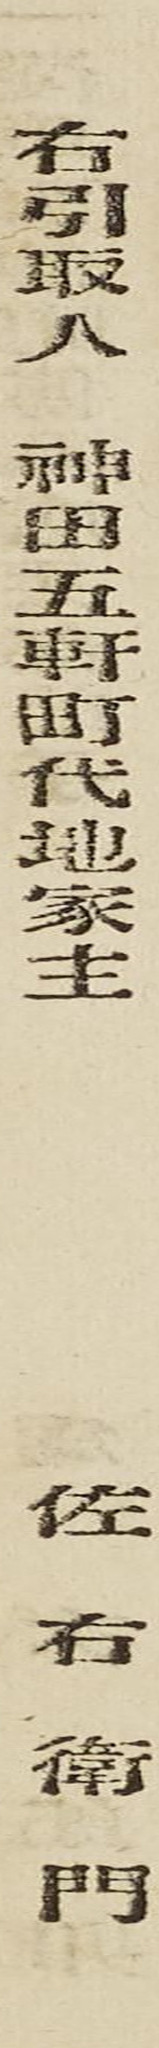右引取人神田五軒町代地家主佐右衛門
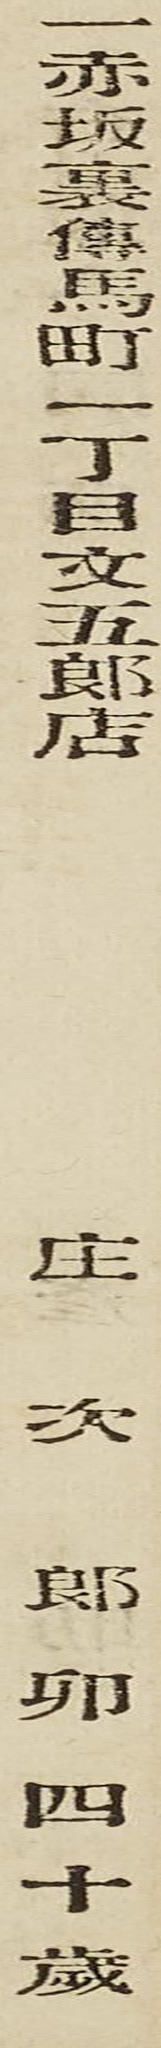一赤坂裏伝馬町一丁目文五郎店庄次郎卯四十歳
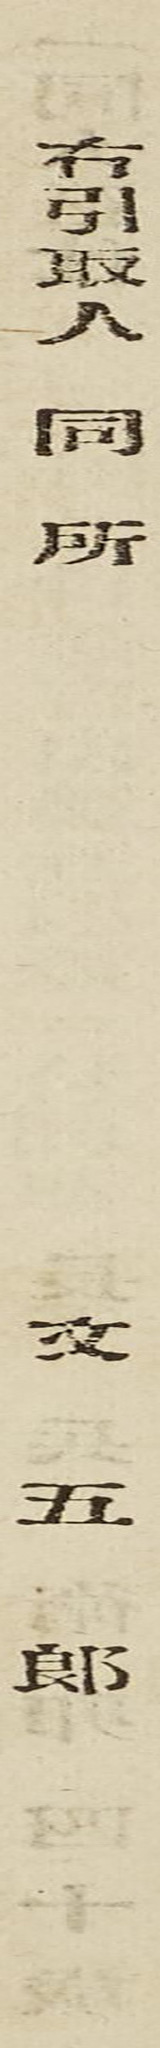右引取人同所文五郎
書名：永代惨話　文化の夢　全
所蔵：東京大学地震研究所図書室 Earthquake Research Institute Library, The University of Tokyo, JAPAN
